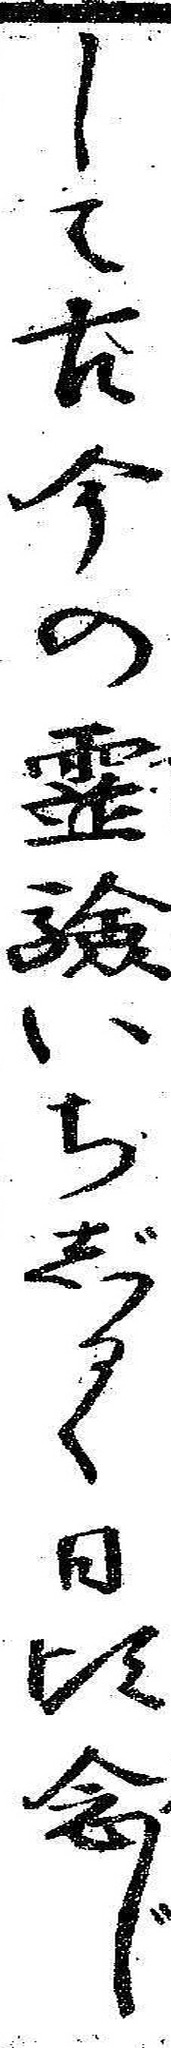して古今の霊験いちじるく日頃念じ
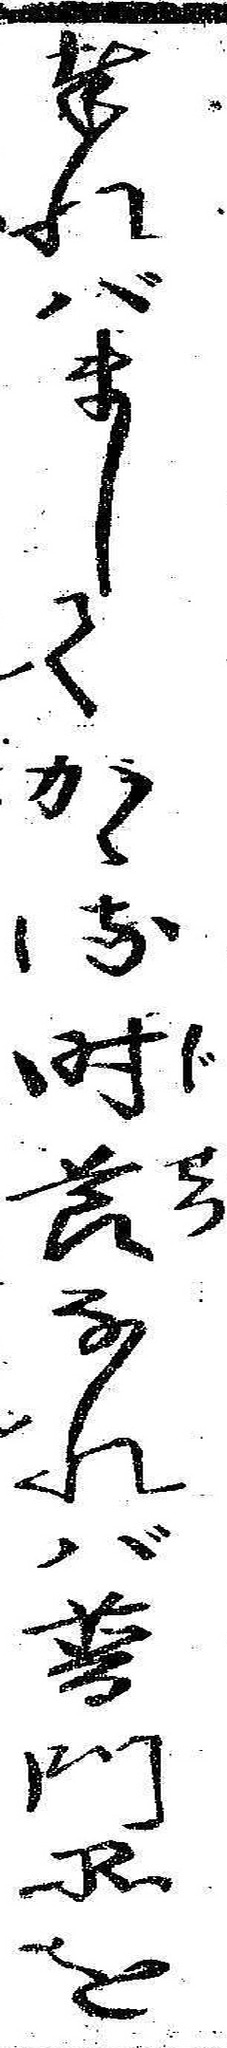奉ればましてかゝる時節なれば普門品を
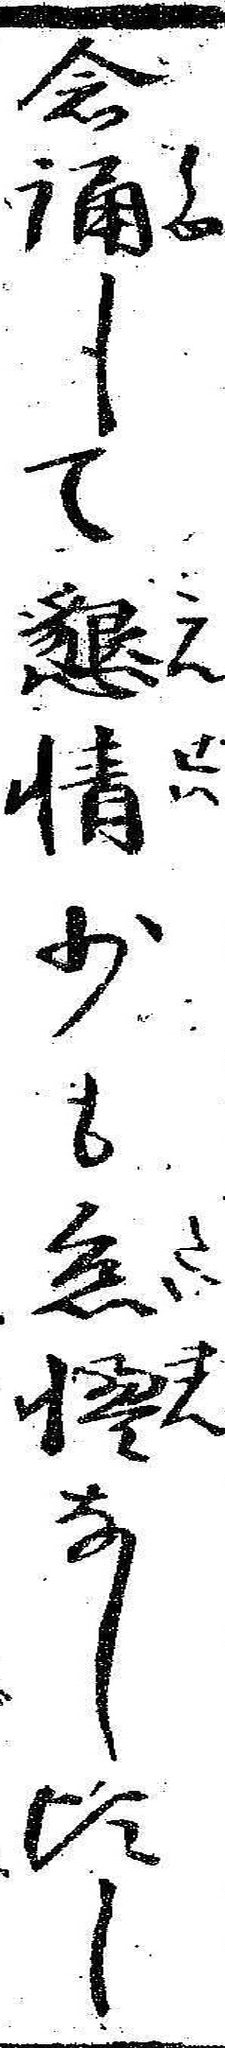念誦して懇情少も怠慢なし頃し
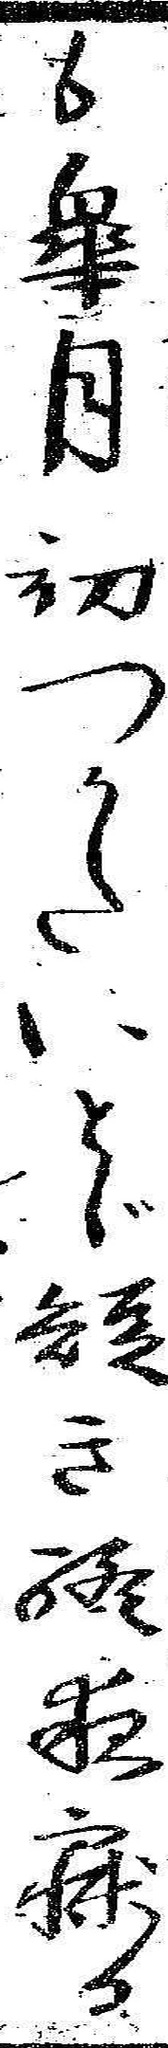も皐月初つかたいとゞ短き終夜寝る
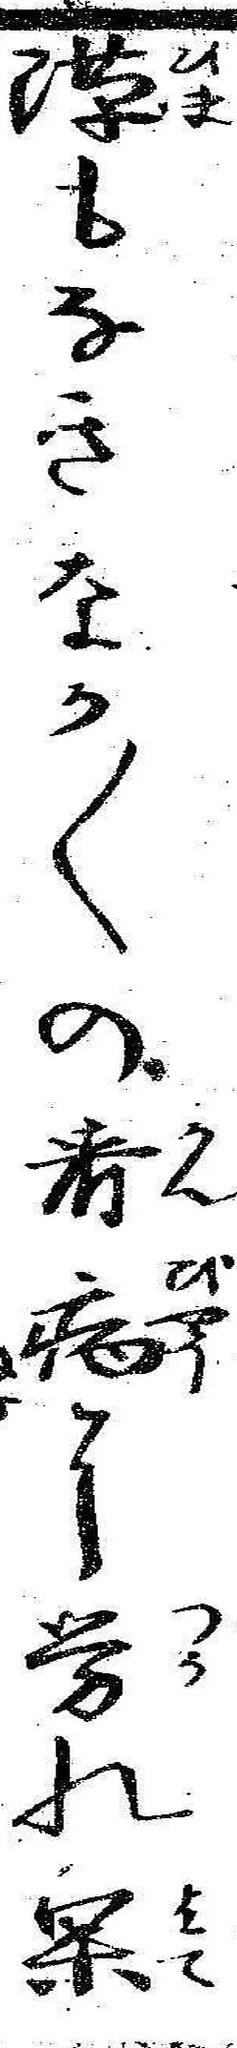隙もなきなか〱の看病に労れ果
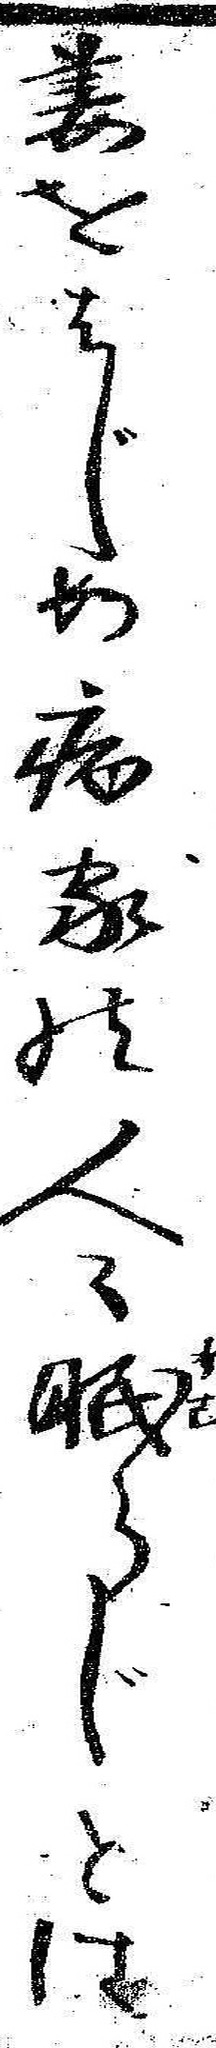妻をはじめ病家の人々眠らじとは

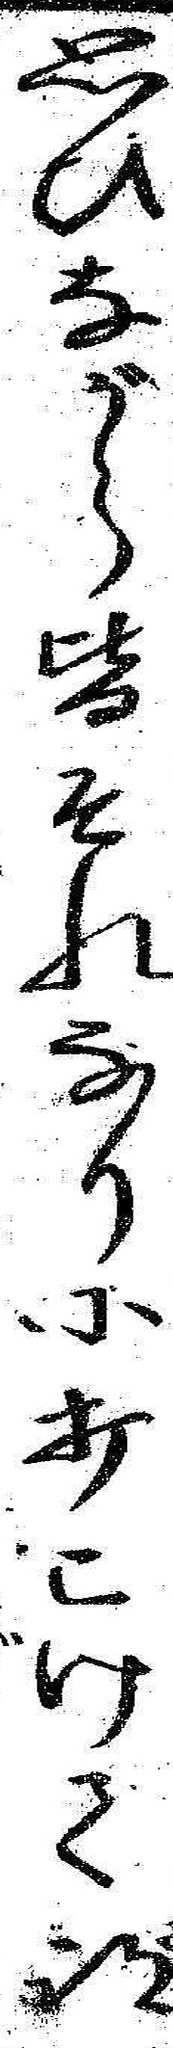思ひながら皆それなりに打こけて跡
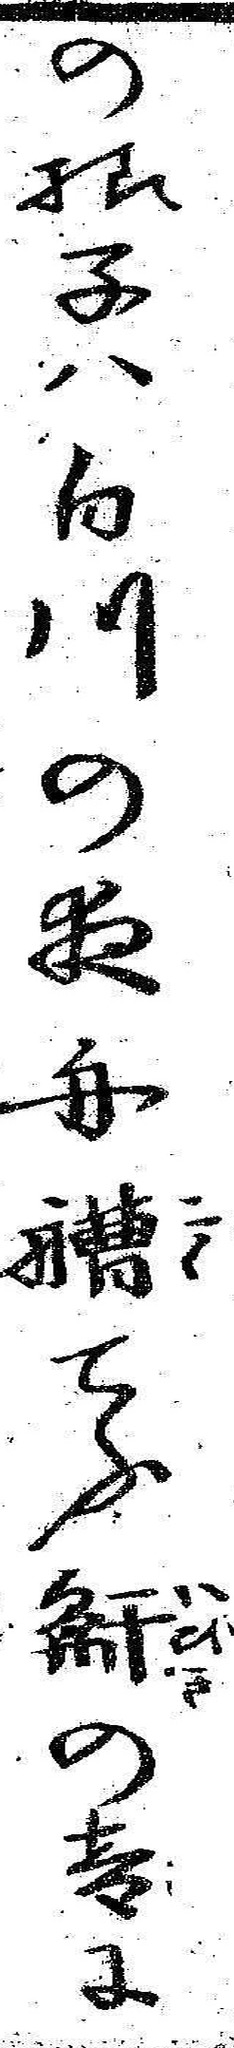の様子は白川の夜舟漕てふ鼾の音に
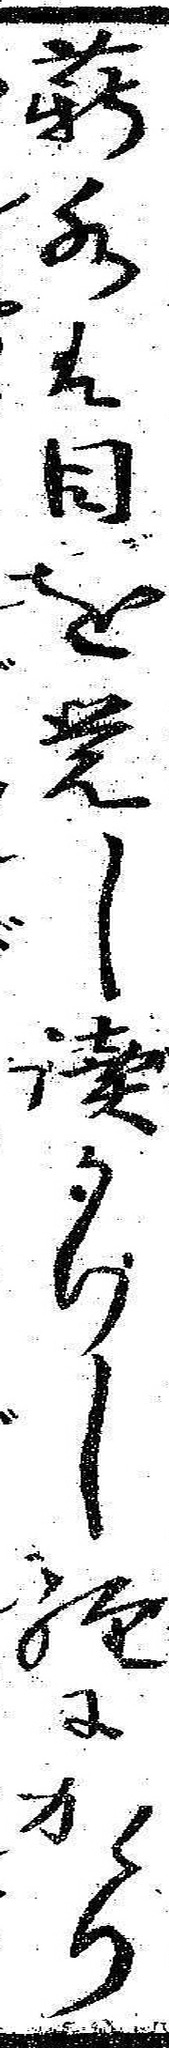薪水は目を覚し読かけし経にかゝり
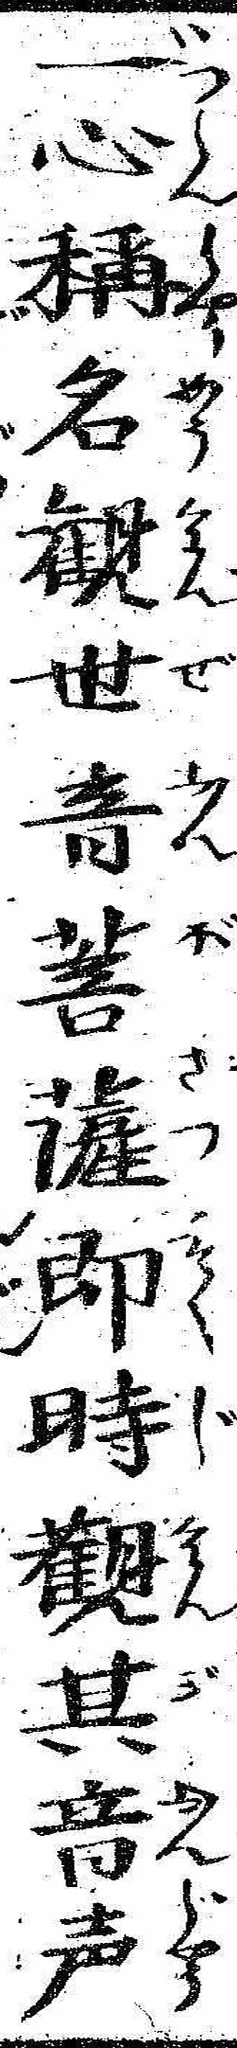一心称名観世音菩薩即時観其音声
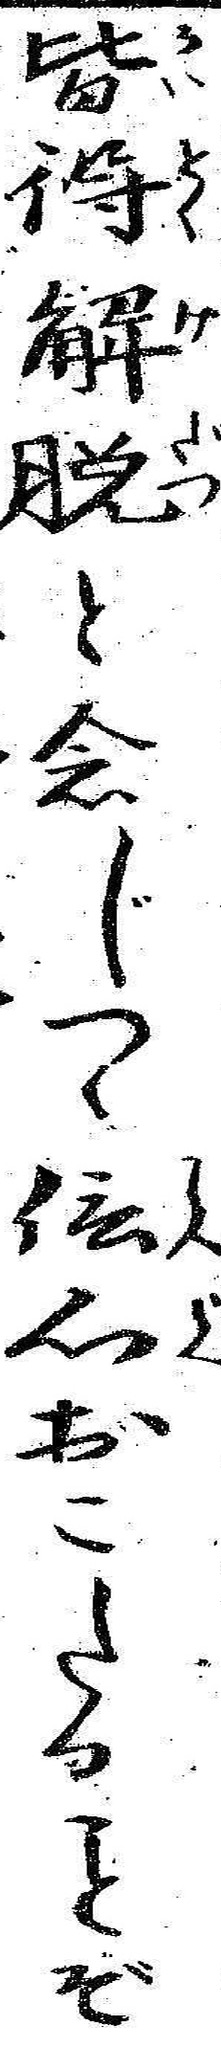皆得解脱と念じつゝ信心おこたることぞ
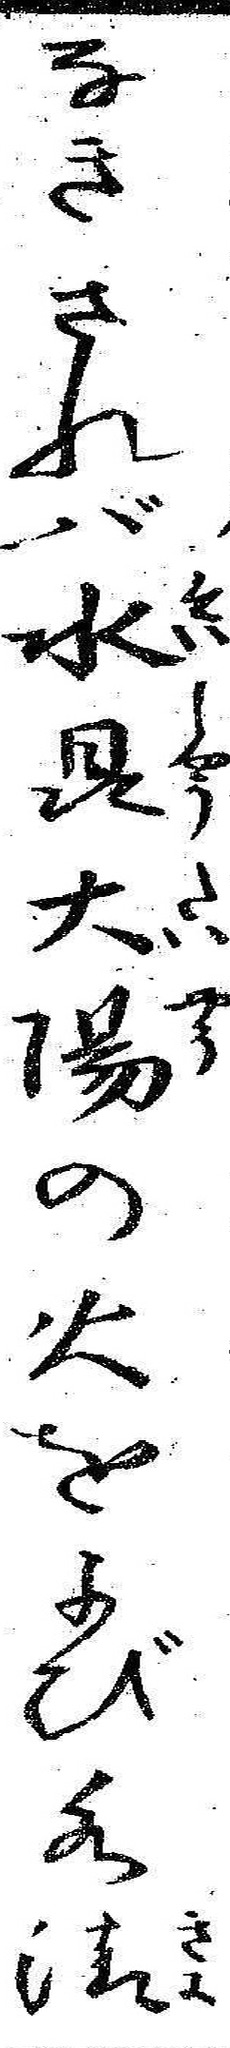なきされば水晶大陽の火をよび水清
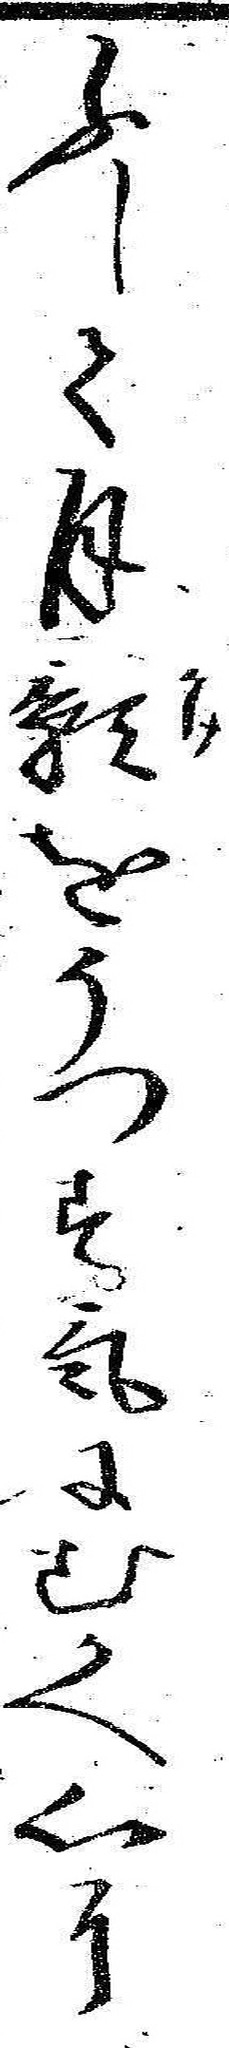ふして月影をうつす気にむかへ心に
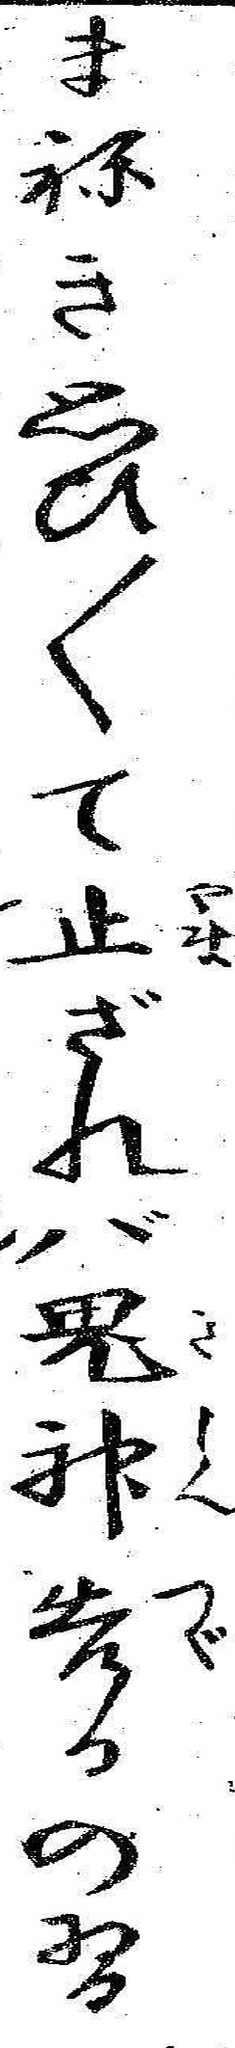まねき思ひ〱て止ざれば鬼神告るの習
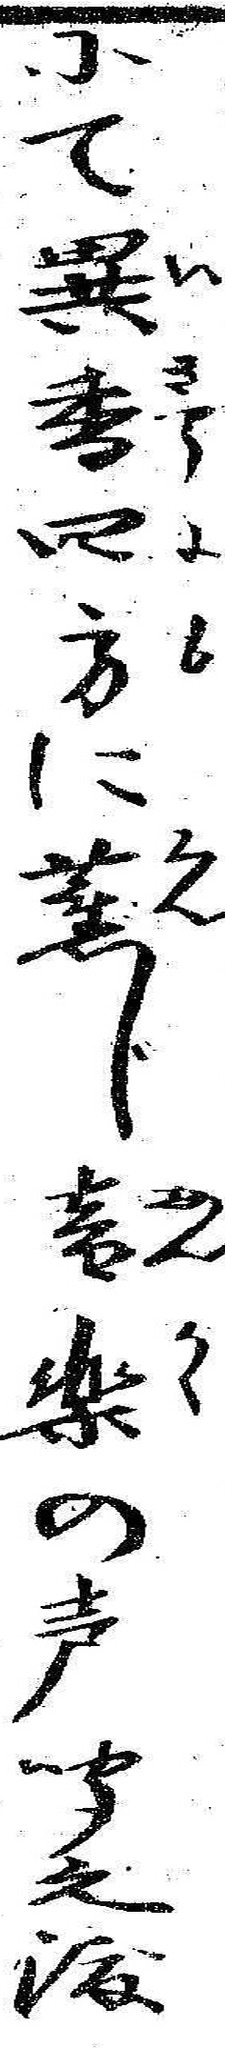にて異香四方に薫じ音楽の声聞之渡
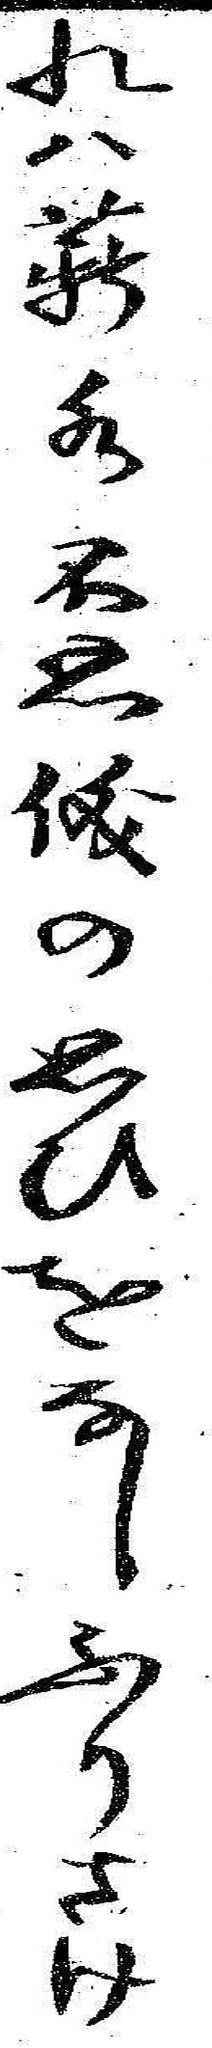れは薪水不思儀の思ひをなしふりさけ
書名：根無草後編
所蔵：国文学研究資料館
